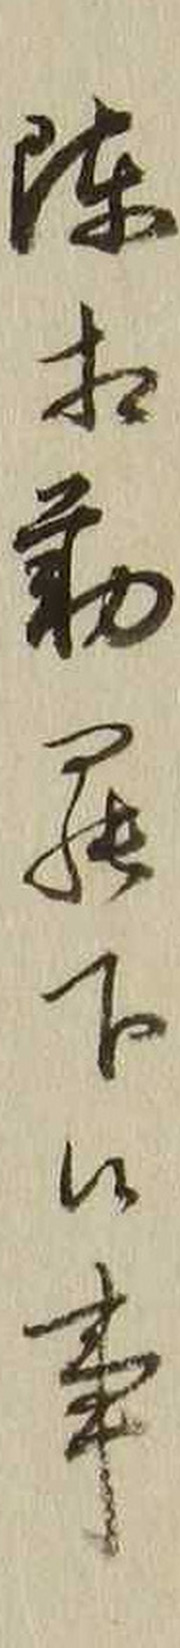陣相勤罷下候事
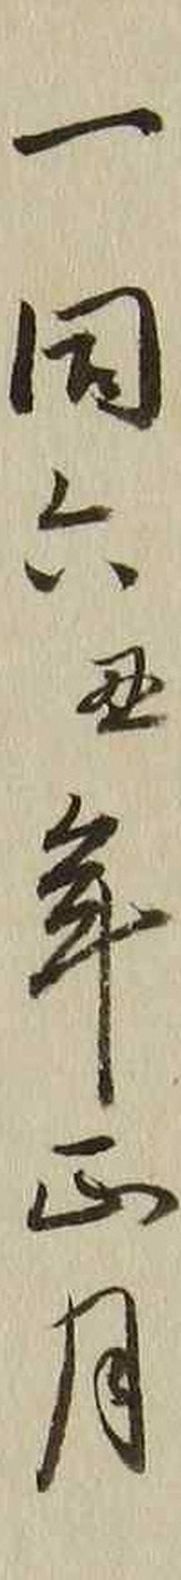一同六丑年正月
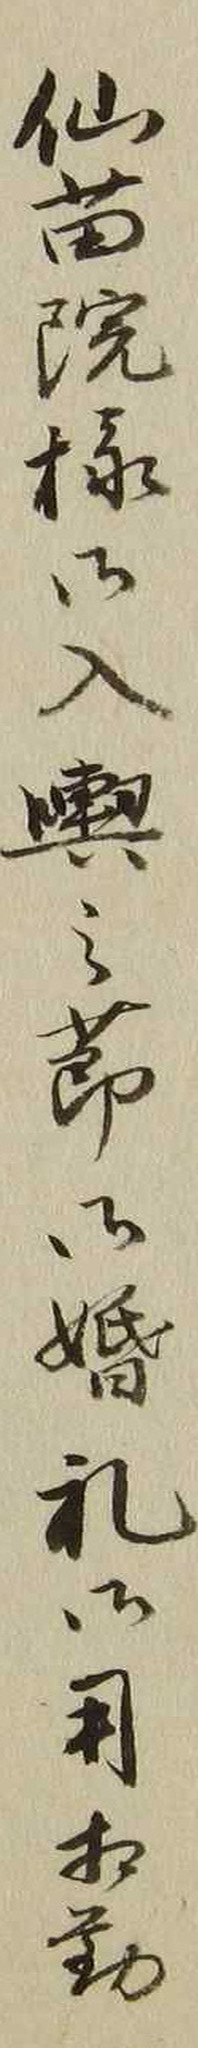仙苗院様御入輿之節御婚礼御用相勤
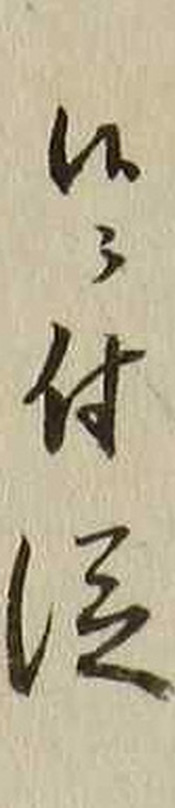候に付従
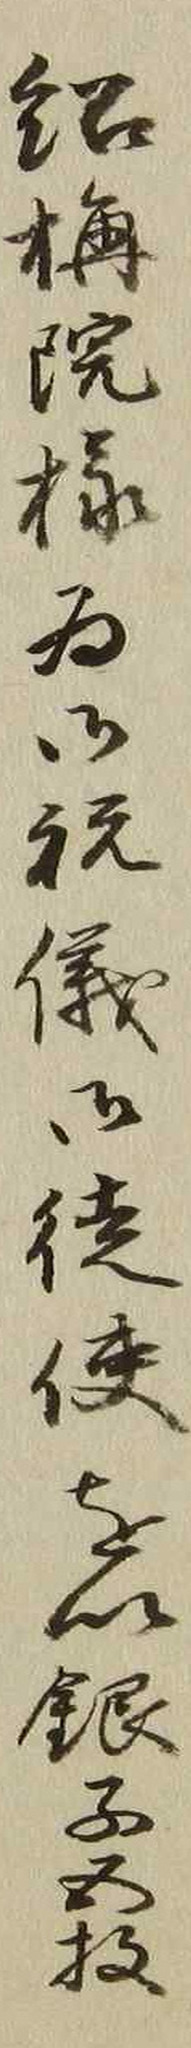紹称院様為御祝儀御徒使を以銀子五枚
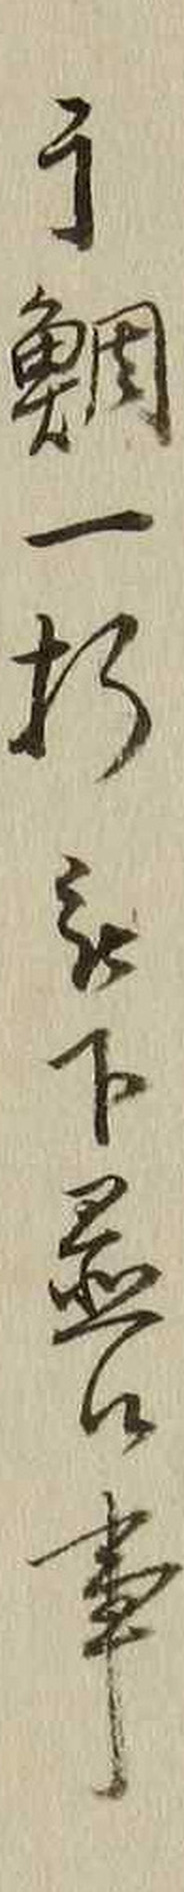干鯛一折を被下置候事
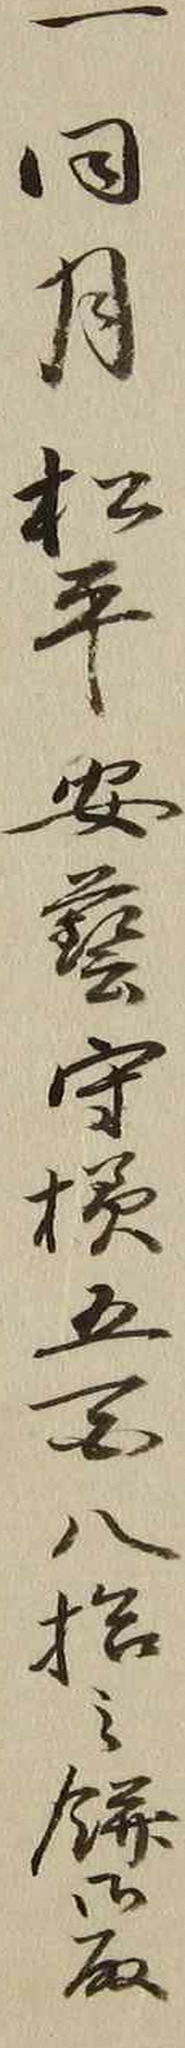一同月松平安芸守様五百八拾之餅御殿
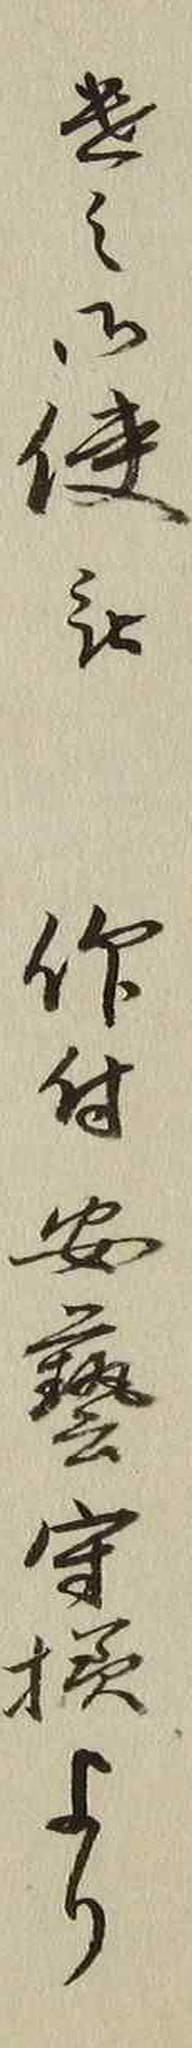遣之御使被仰付安芸守様より
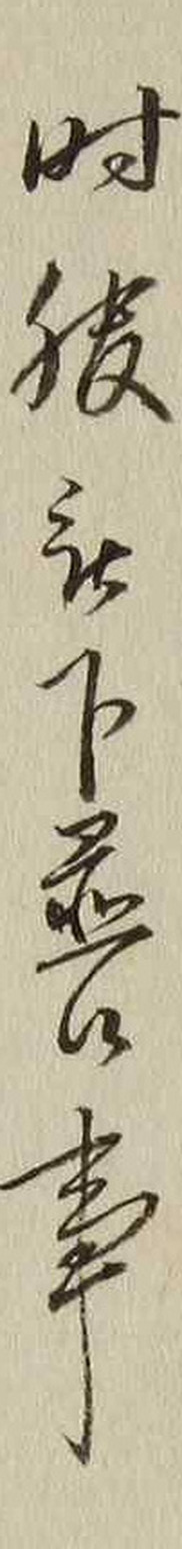時服被下置候事
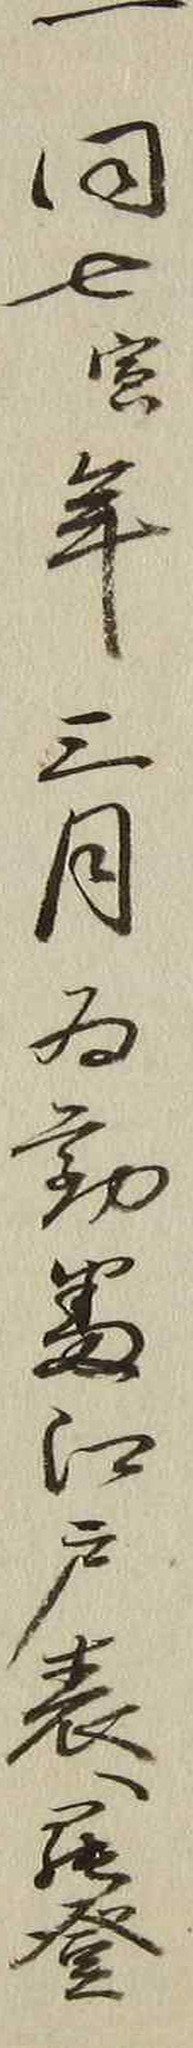一同七寅年三月為勤番江戸表へ罷登
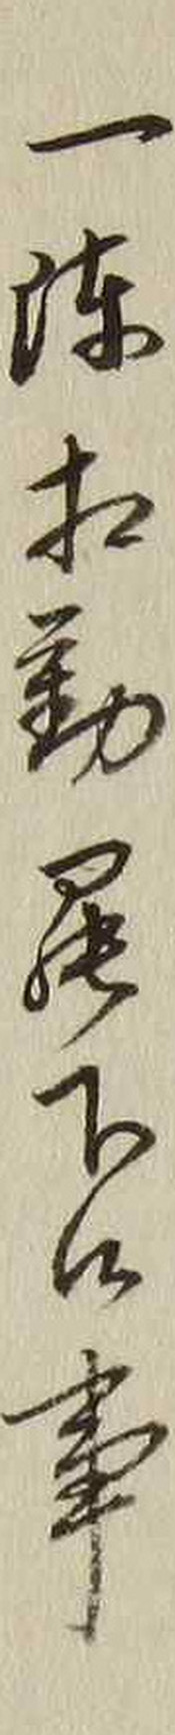一陣相勤罷下候事
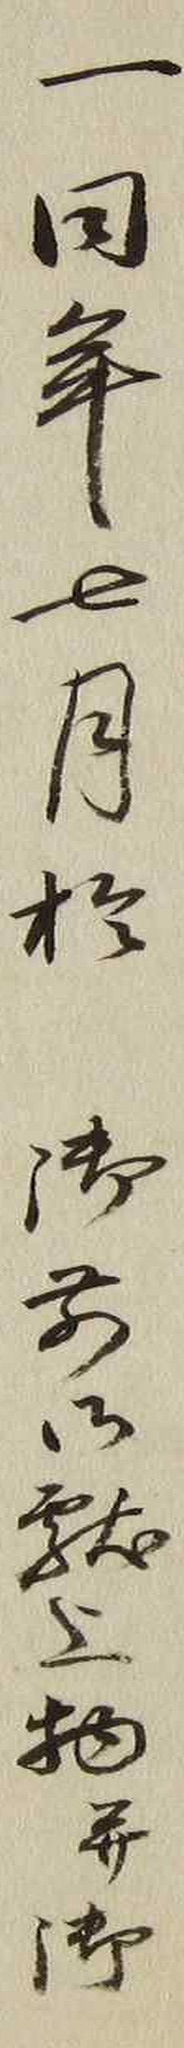一同年七月於御前御献上物并御
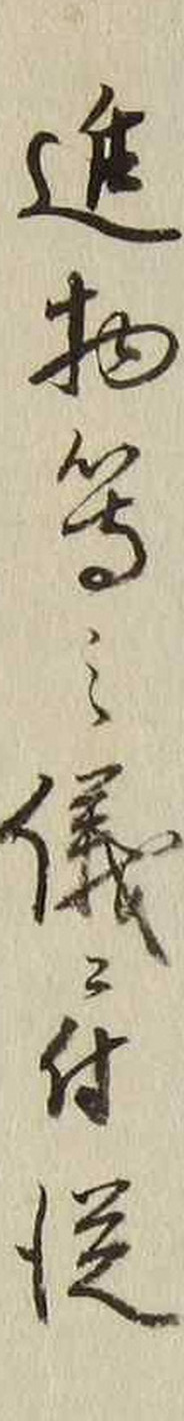進物等之儀に付従
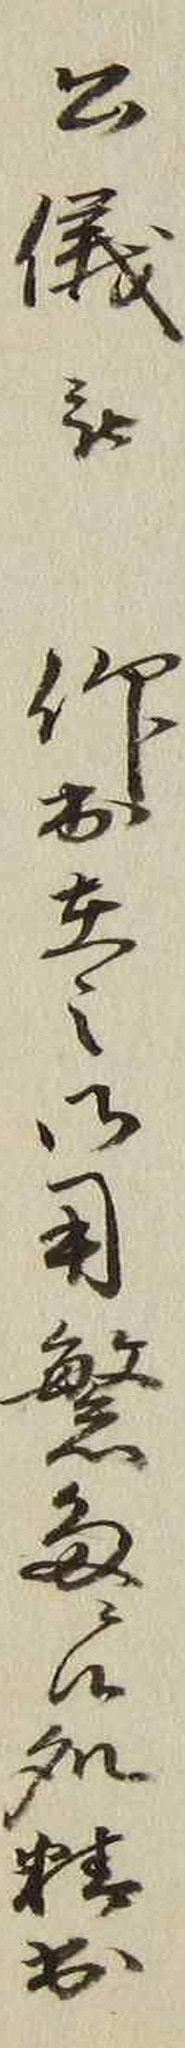公儀被仰出在之御用繁多に候処精出
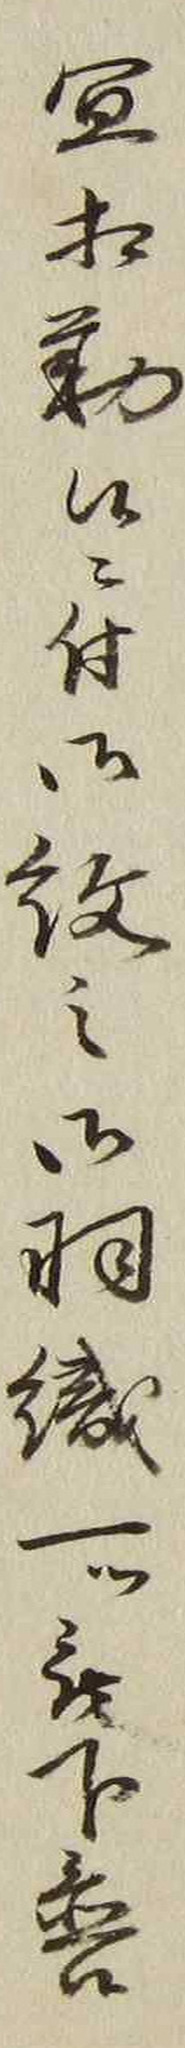宜相勤候に付御紋之御羽織一つ被下置候
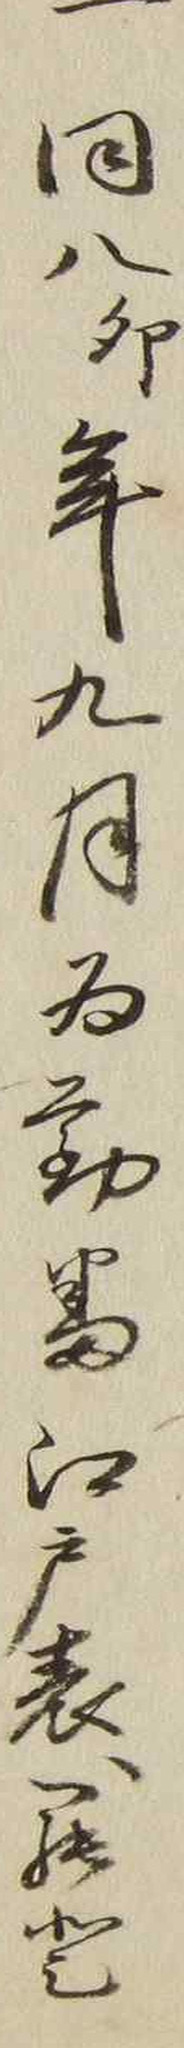一同八卯年九月為勤番江戸表へ罷登
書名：諸士系譜　巻之133　た之部9
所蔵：会津若松市立会津図書館
